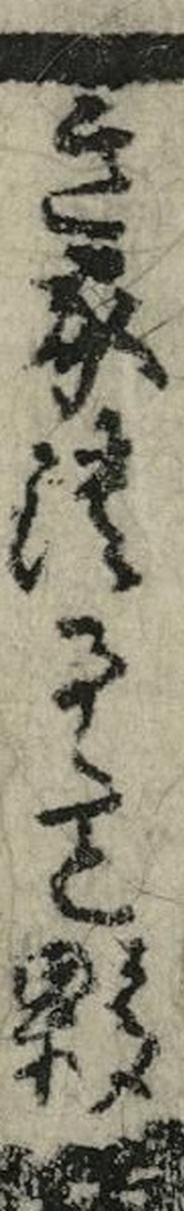き家潰るゝこと夥
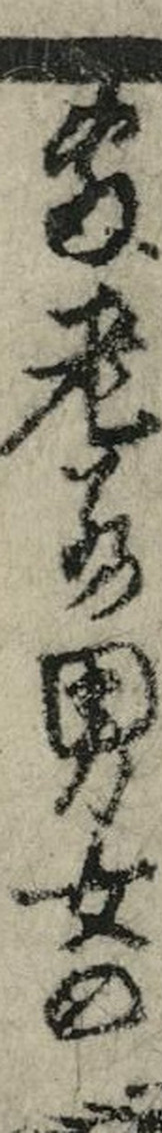敷老若男女の
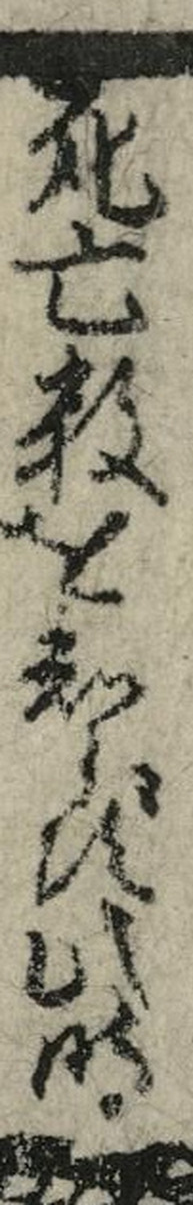死亡数を知らず此時
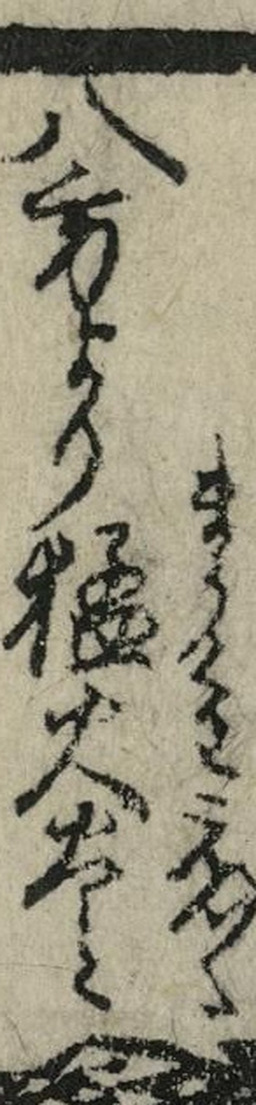八方より猛火炎々
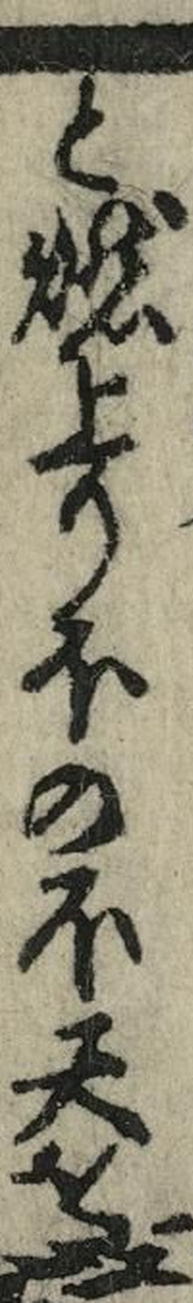と燃上りほのほ天を
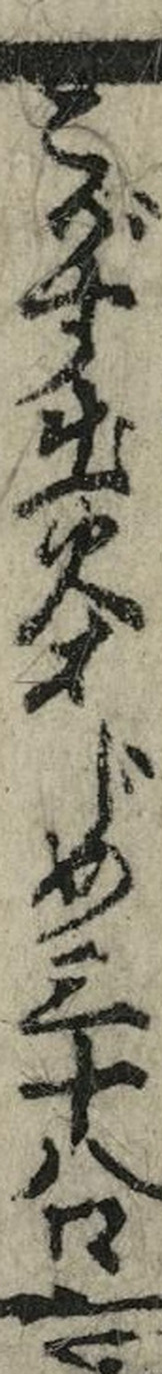こがす出火はじめ三十八口
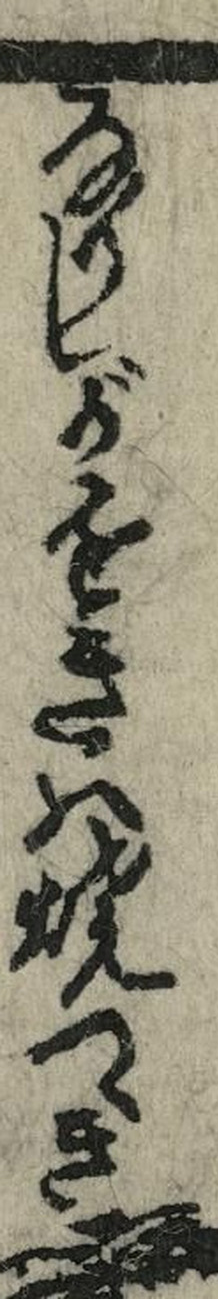なりしが近きは燃つゝき
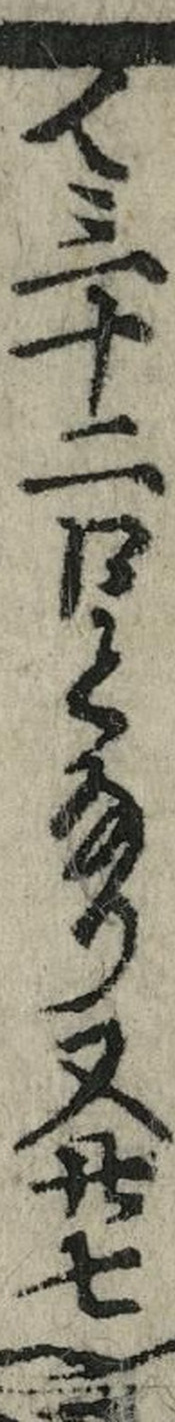て三十二口となり廿七
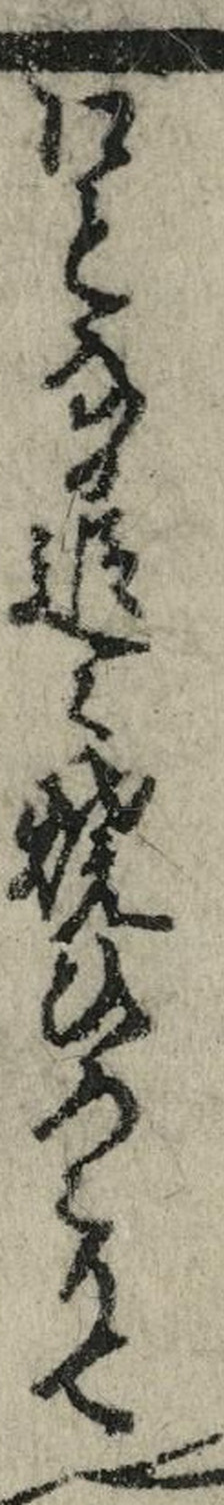口となる追々焼ひろかりて
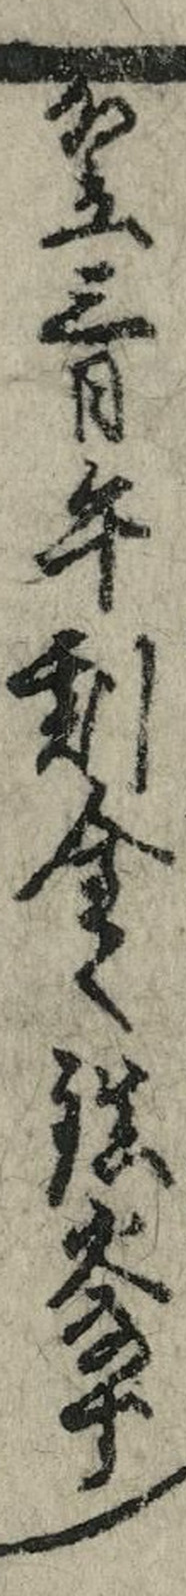翌三日午刻全く鎮火なす
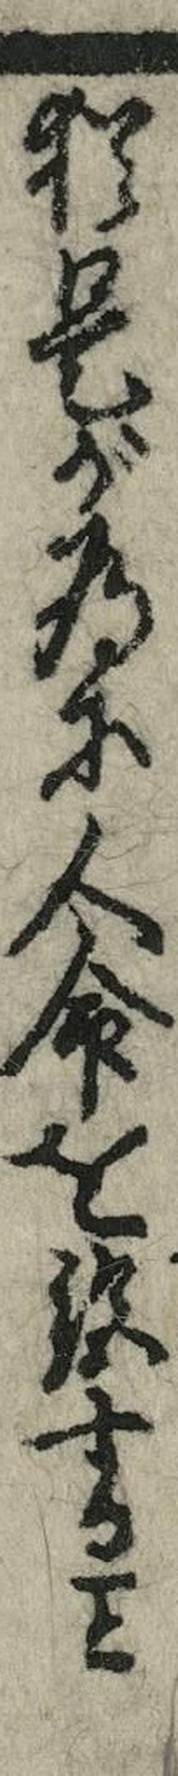猶是が為に人命を絶すること
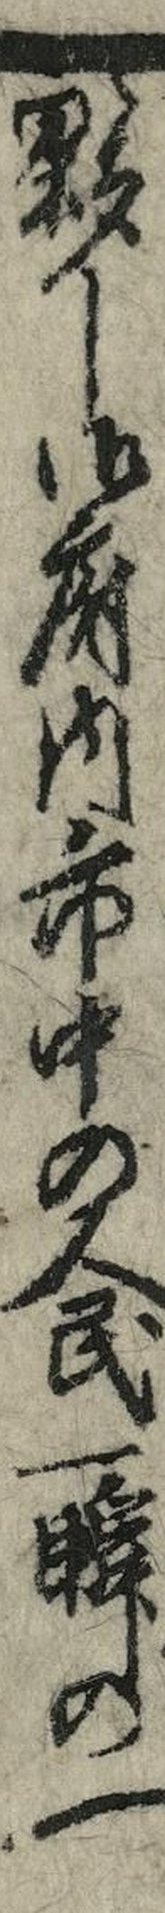夥し御府内市中の人民一瞬の
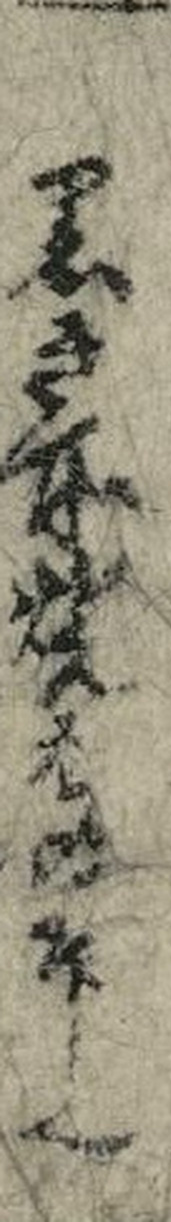黒き所焼ばの印也
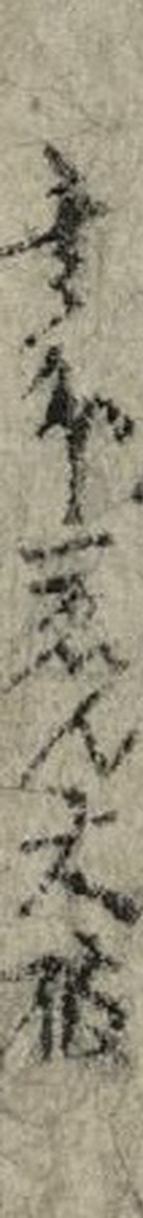其外一ゑん大破
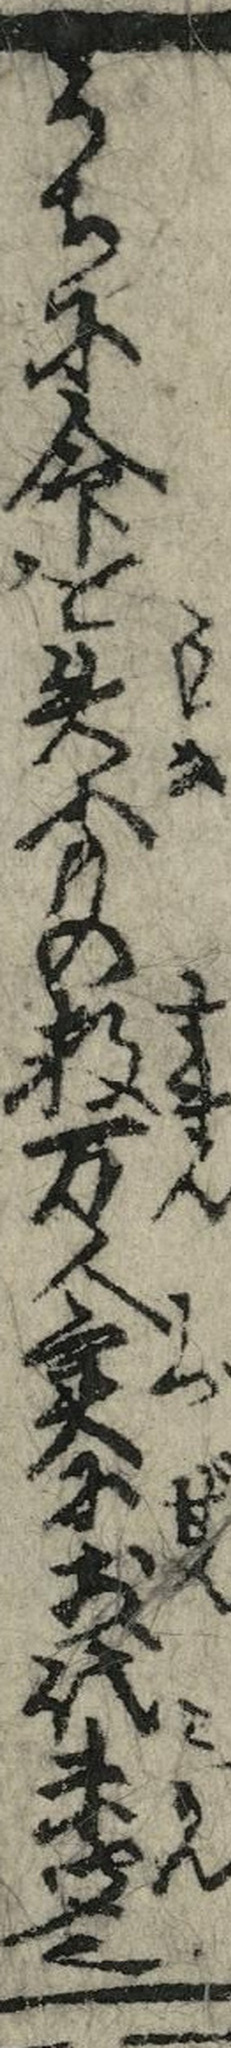うちに命を失ふもの数万人実に前代未聞也

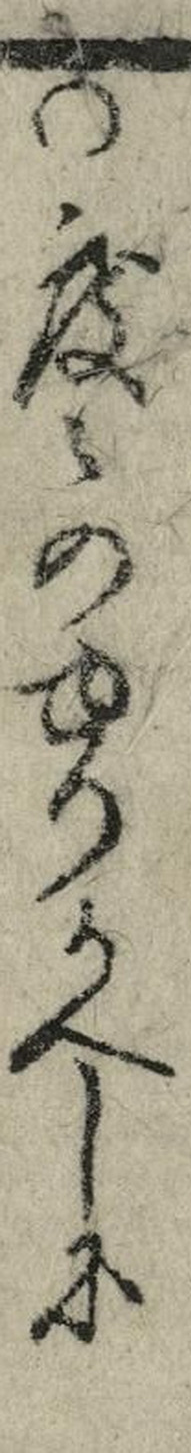度々のゆりかへしに
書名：江戸　大地震末代噺の種　全
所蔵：東京大学地震研究所図書室 Earthquake Research Institute Library, The University of Tokyo, JAPAN
